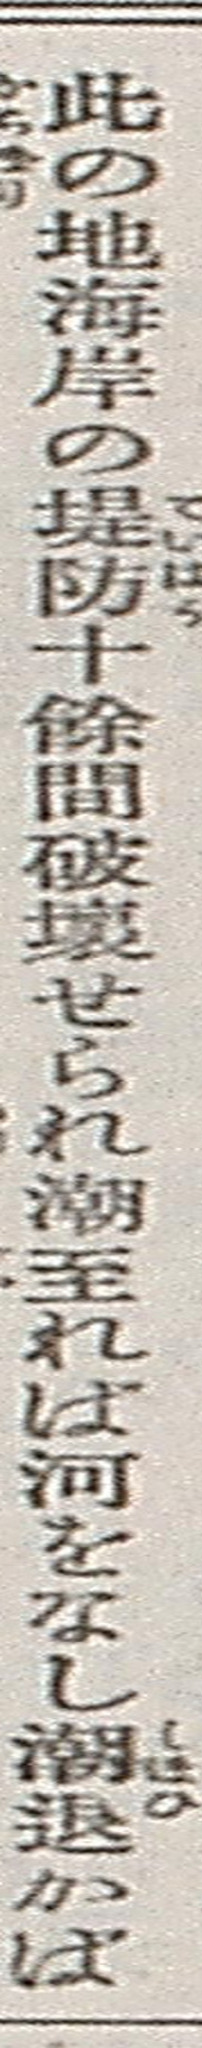此の地海岸の堤防十余間破壊せられ潮至れば河をなし潮退かば
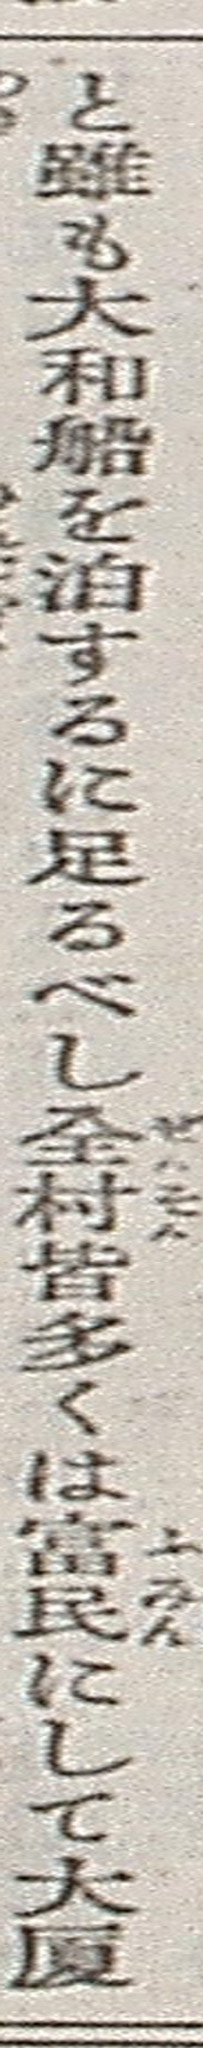と雖も大和船を泊するに足るべし全村皆多くは富民にして大厦
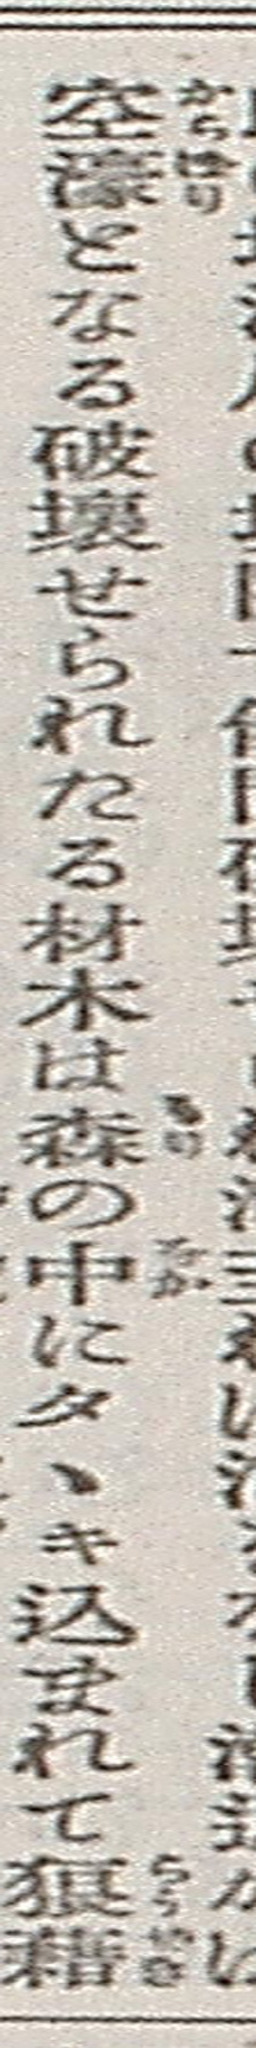空濠となる破壊せられたる材木は森の中にタヽキ込まれて狼藉
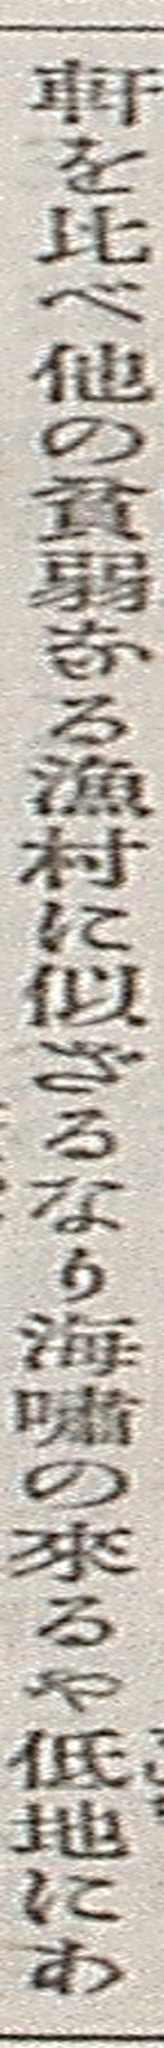軒を比べ他の貧弱なる漁村に似ざるなり海嘯の来るや低地にあ
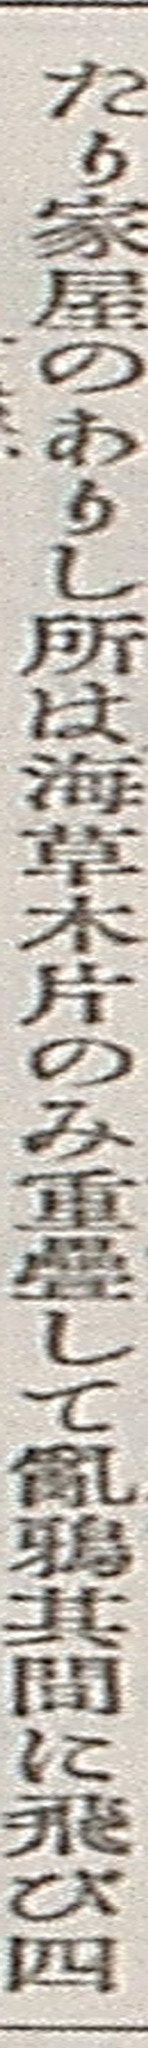たり家屋のありし所は海草木片のみ重畳して乱鴉其間に飛び四
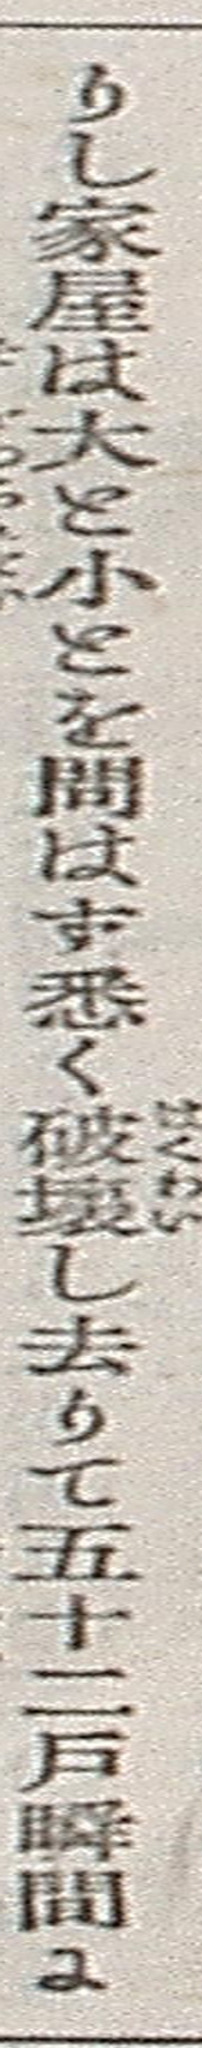りし家屋は大と小とを問はず悉く破壊し去りて五十二戸瞬間に
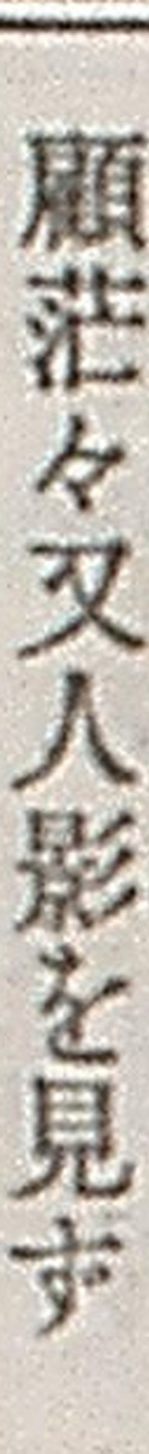顧茫々又人影を見ず
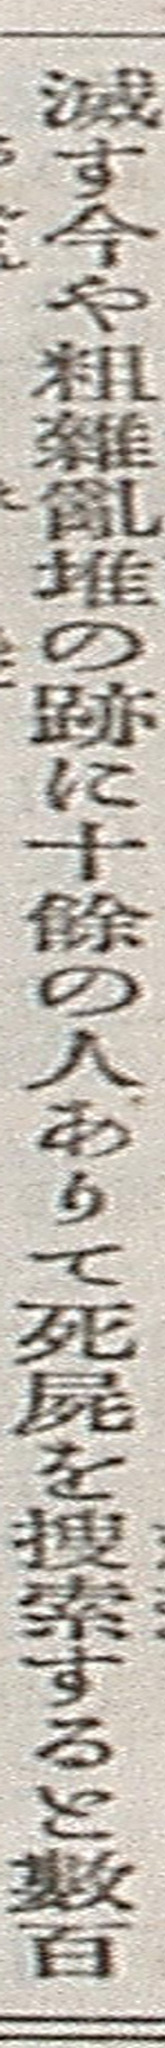滅す今や粗雑乱堆の跡に十余の人ありて死屍を捜索すると数百
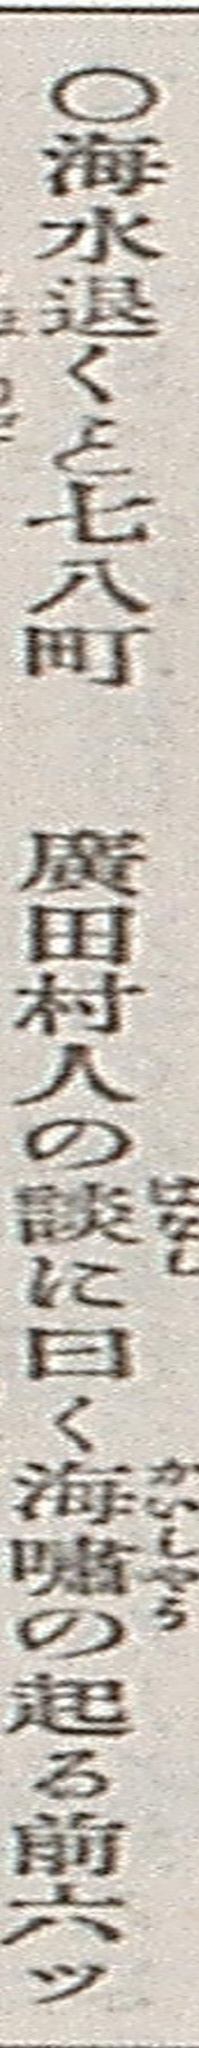○海水退くこと七八町広田村人の談に曰く海嘯の起る前六ッ
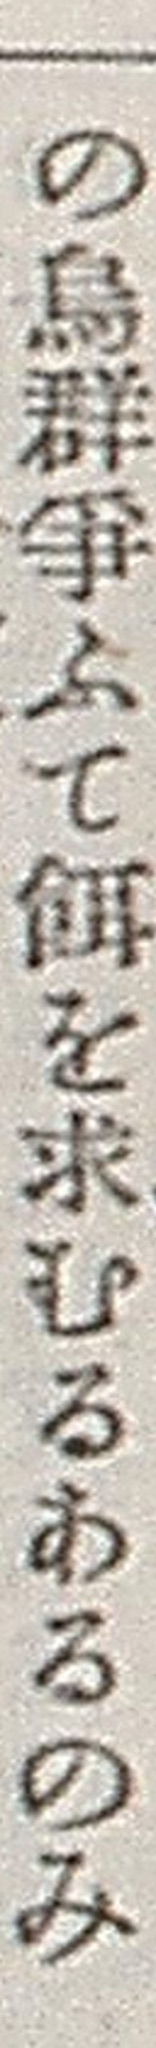の鳥群争ふて餌を求むるあるのみ
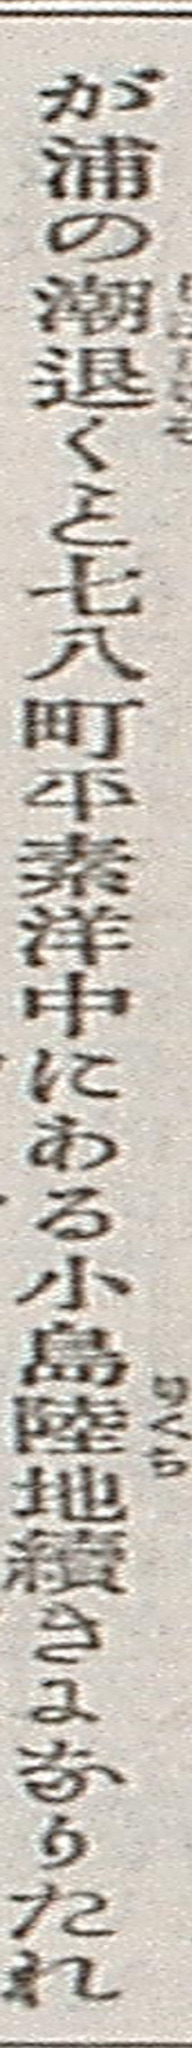が浦の潮退くこと七八町平素洋中にある小島陸地続きになりたれ
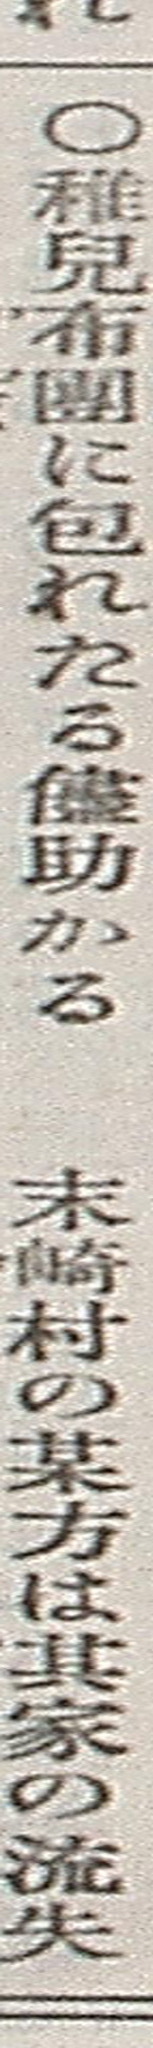○稚児布団に包れたる侭助かる末崎村の某方は其家の流失
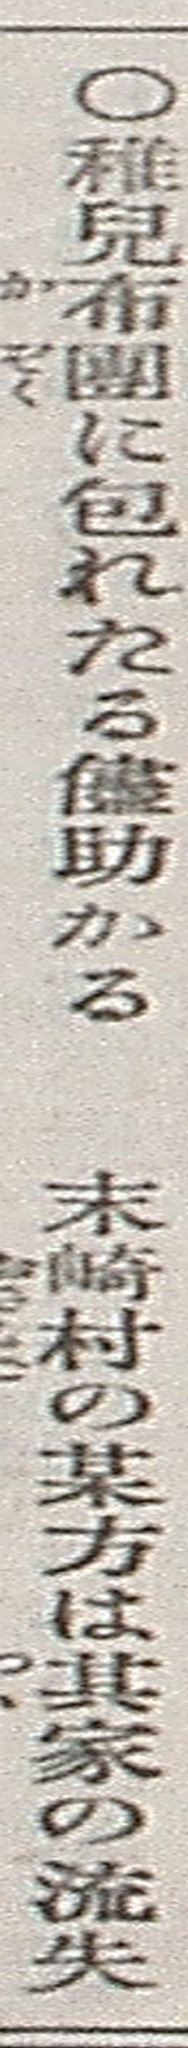○稚児布団に包れたる侭助かる末崎村の某方は其家の流失
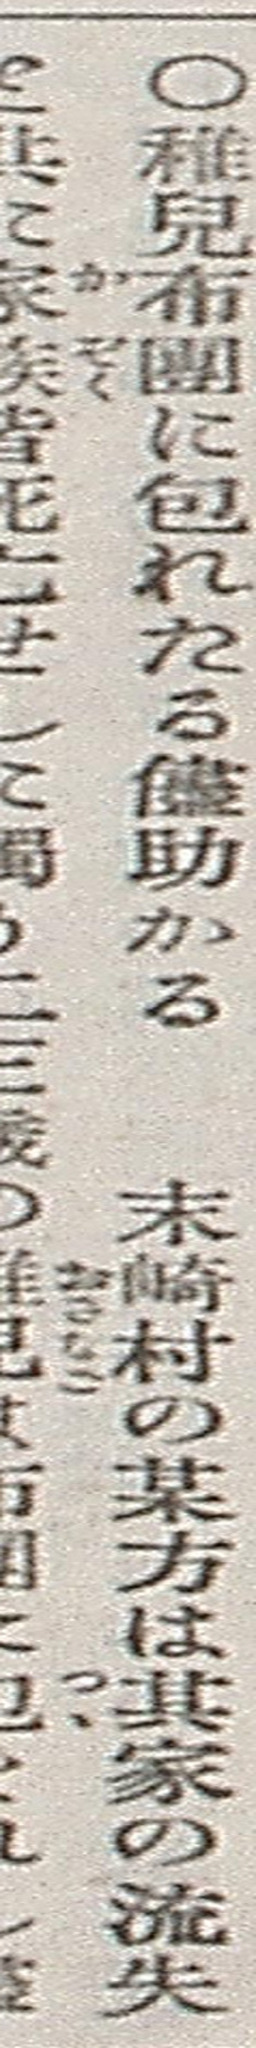と共に家族皆死亡せしに独り二三歳の稚児は布団に包まれし侭
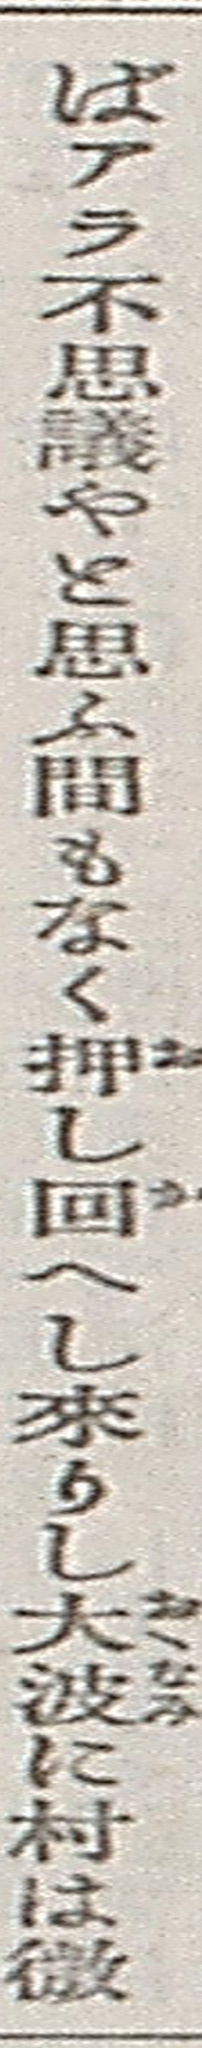ばアラ不思議やと思ふ間もなく押し回へし来りし大波に村は微
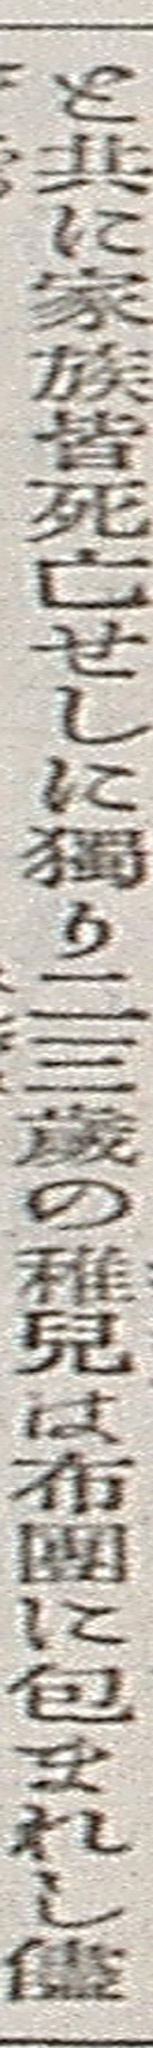と共に家族皆死亡せしに独り二三歳の稚児は布団に包まれし侭
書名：風俗畫報臨時増刊第百十九號　大海嘯被害録（中）
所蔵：東京大学地震研究所図書室 Earthquake Research Institute Library, The University of Tokyo, JAPAN
